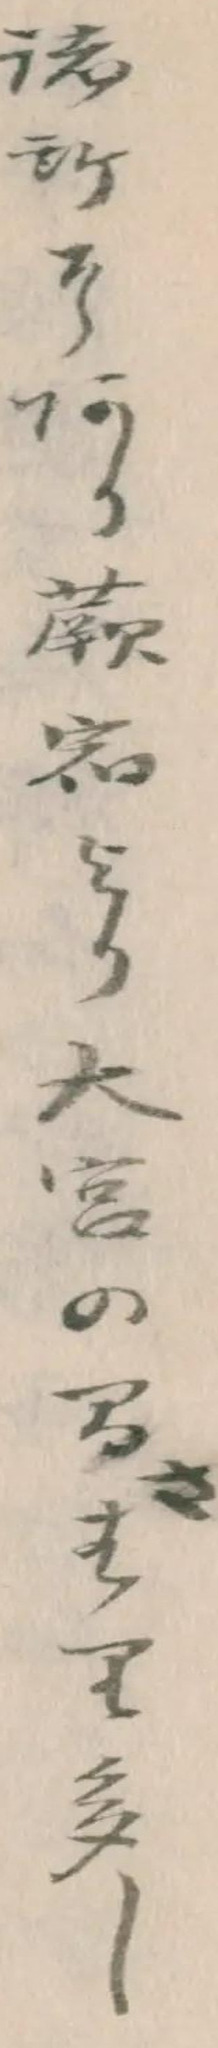諸所にあり蕨宿より大宮の間さはり多し
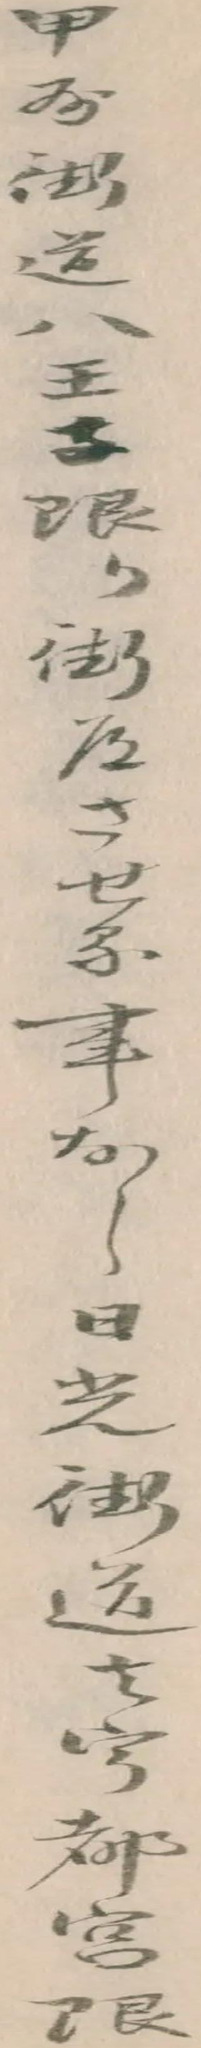甲州街道八王子限り街道させる事なし日光街道は宇都宮限
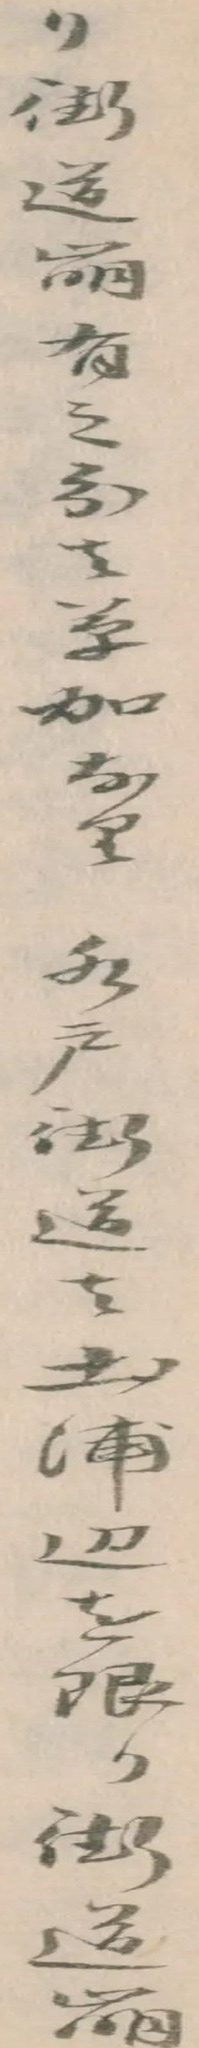り街道崩有之分は草加なり水戸街道は土浦辺を限り街道崩
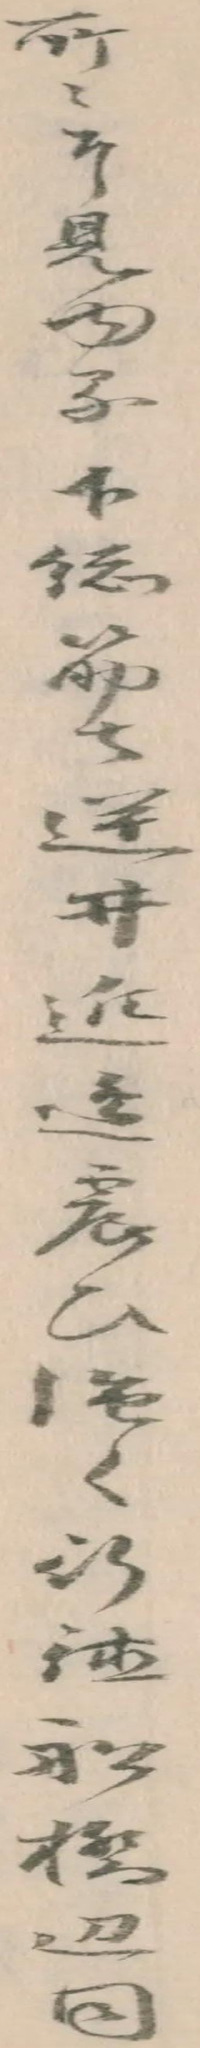所々に見ゆる下総筋は逆井近辺震ひ強く行徳船橋辺同
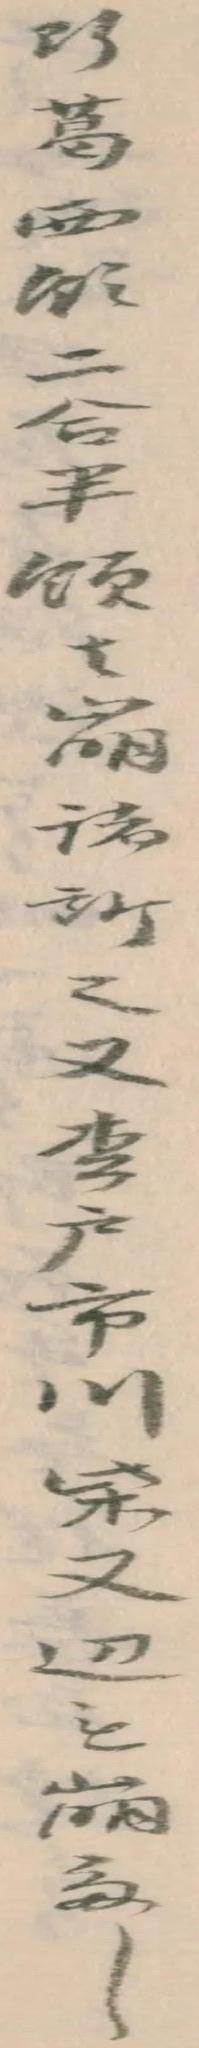所葛西領二合半領は崩諸所也又松戸市川柴又辺も崩多し
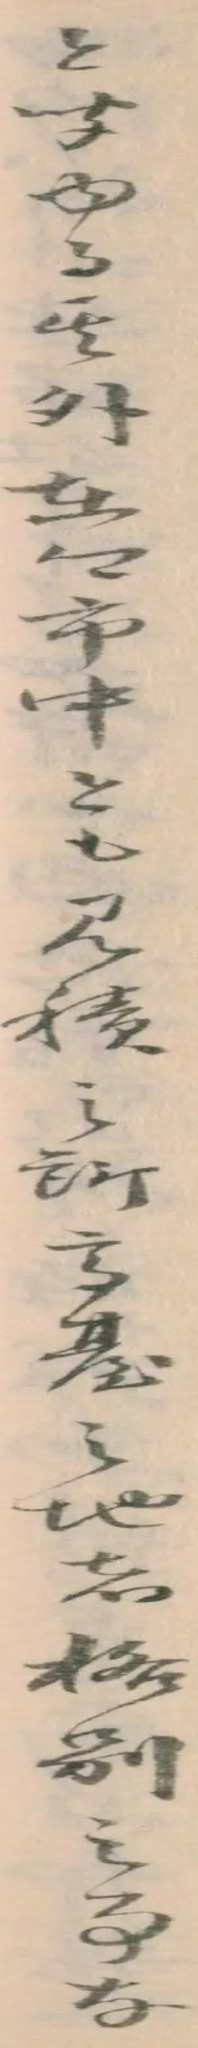と聞ゆる其外在郷市中とも見積之所高台之地は格別之事な
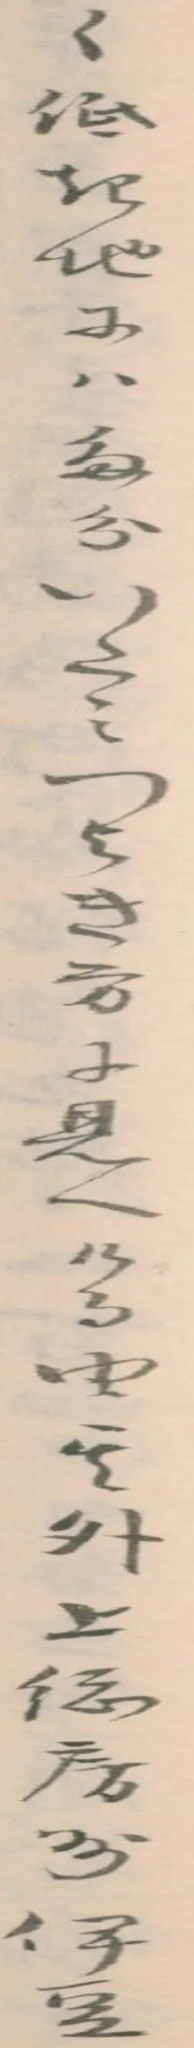く低き地には多分いたみつよき方に見へける由其外上総房州伊豆
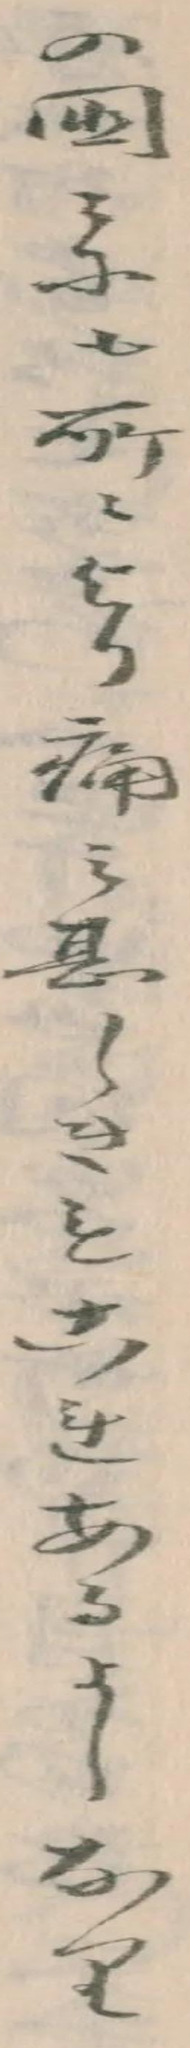の国々にも所々より痛み甚しきもこれあるよしなり
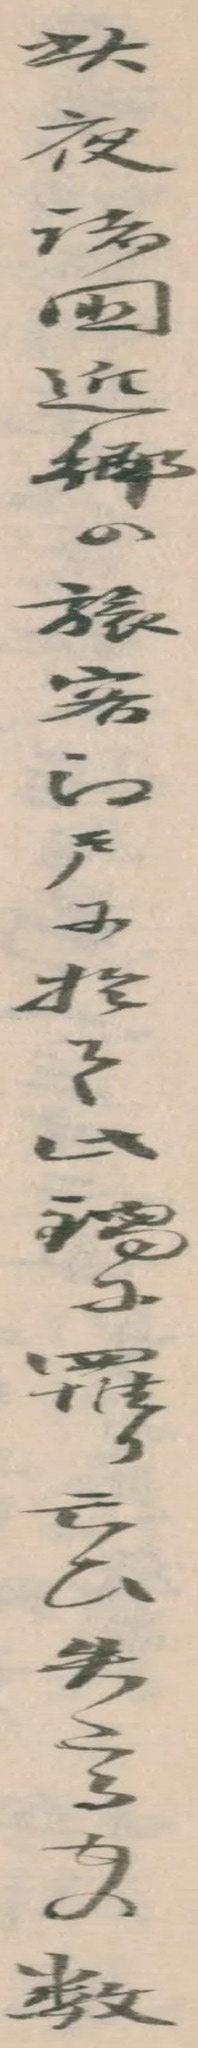此夜諸国近郷の旅宿江戸に於て此鍋に罹り亡ひ失たるもの数
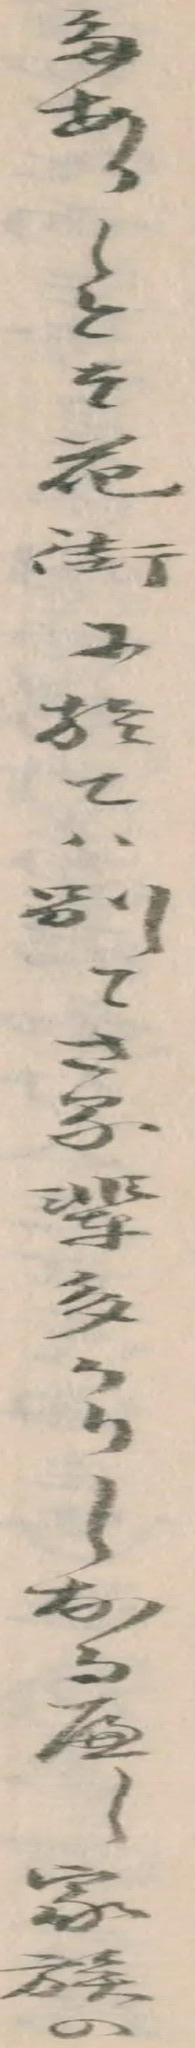多ありしとそ花街に於ては別てさる輩多かりしなるへし家族の
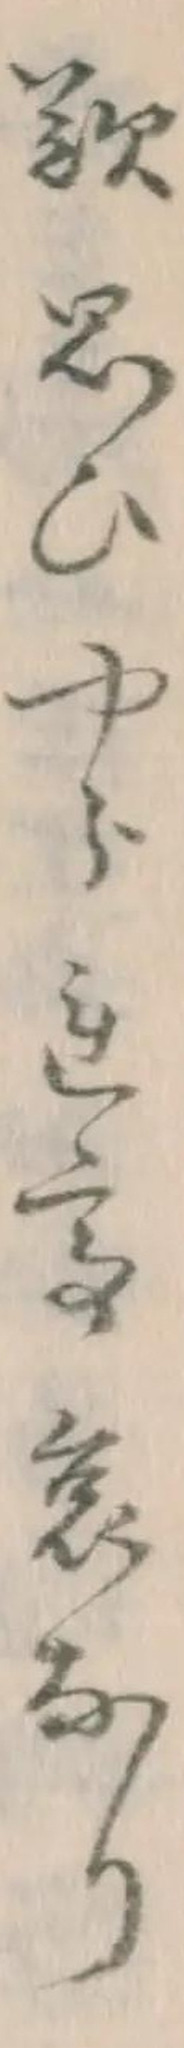歎思ひやられて哀なり

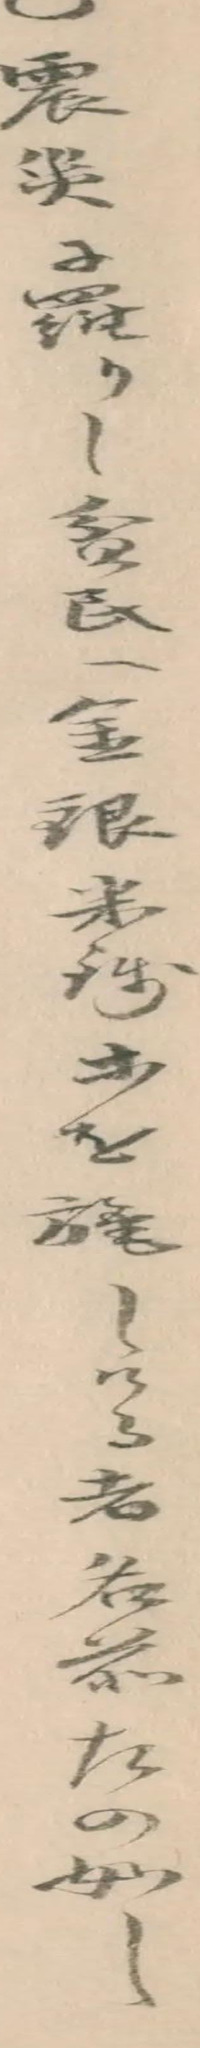〇震災に罹りし貧民へ金銀米銭等を施しける者名前左の如し
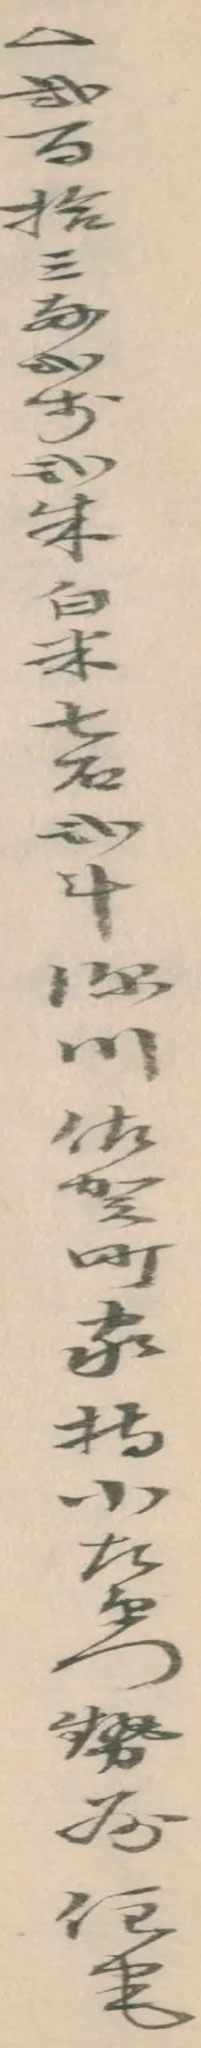△弐百拾三両弐歩弐朱白米七石弐斗深川佐賀町家持小左衛門勢州住宅
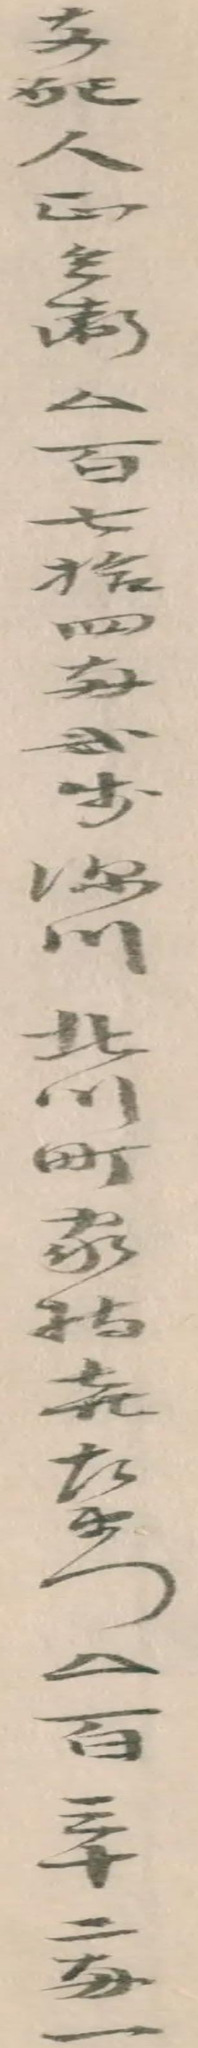支配人正兵衛△百七拾四両弐歩深川北川町家持喜左衛門△百三十二両一
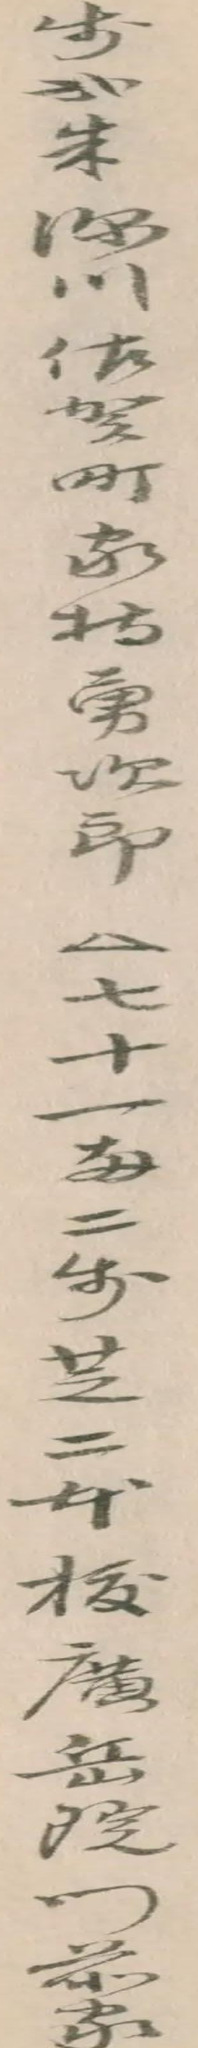歩弐朱深川佐賀町家持勇次郎△七十一両二歩芝二本榎広岳院門前家
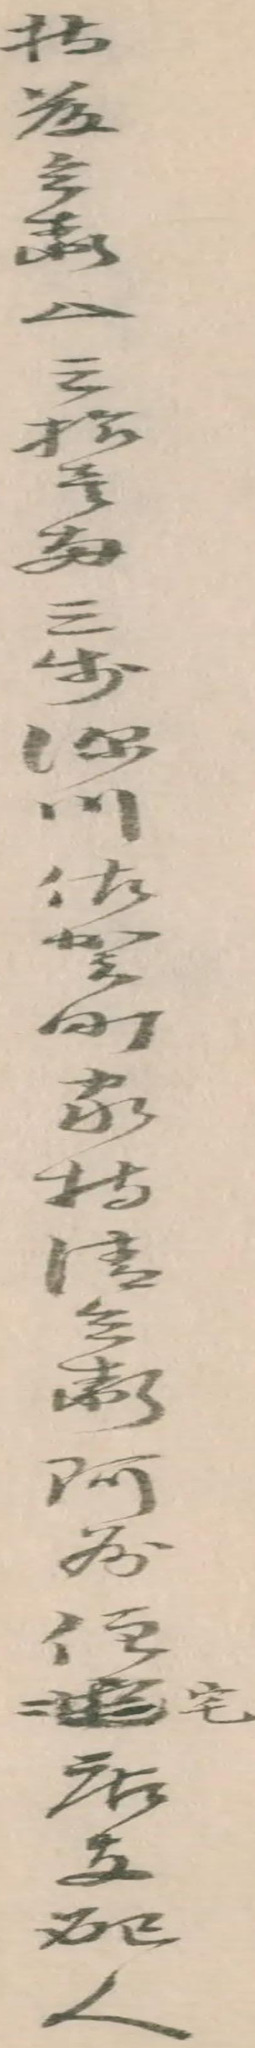持藤兵衛△三拾壱両三歩深川佐賀町家持清兵衛阿州住宅店支配人
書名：地災撮要. 巻10(地震之部) 上,下
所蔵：国立国会図書館 National Diet Library, JAPAN
